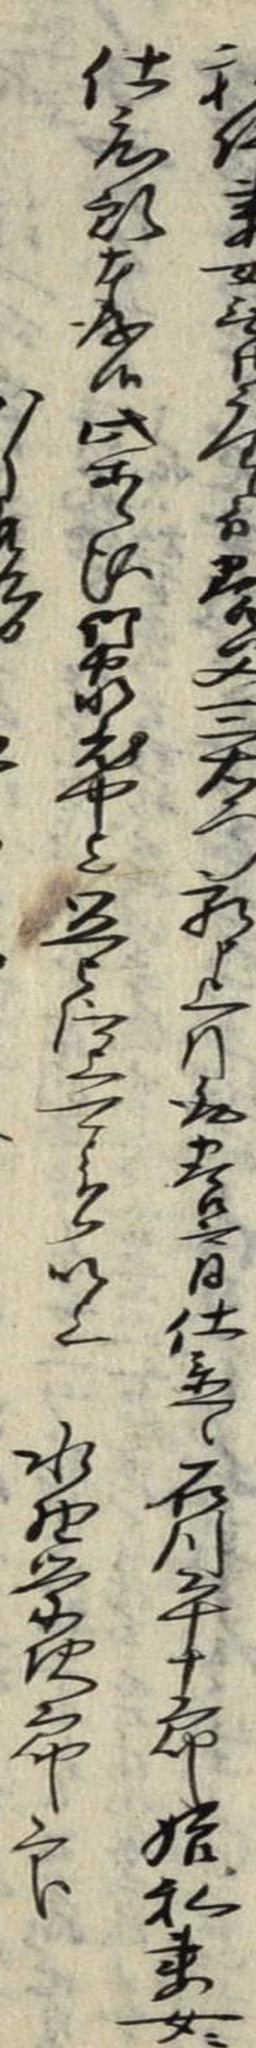仕度願奉存候此等之趣御家老中迄宜被仰上可被下候以上水野栄次郎印
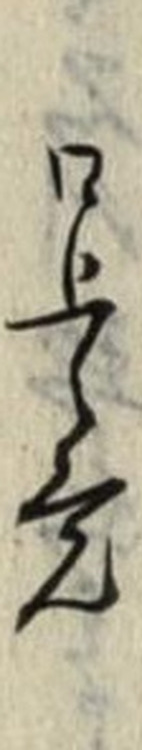口上之覚
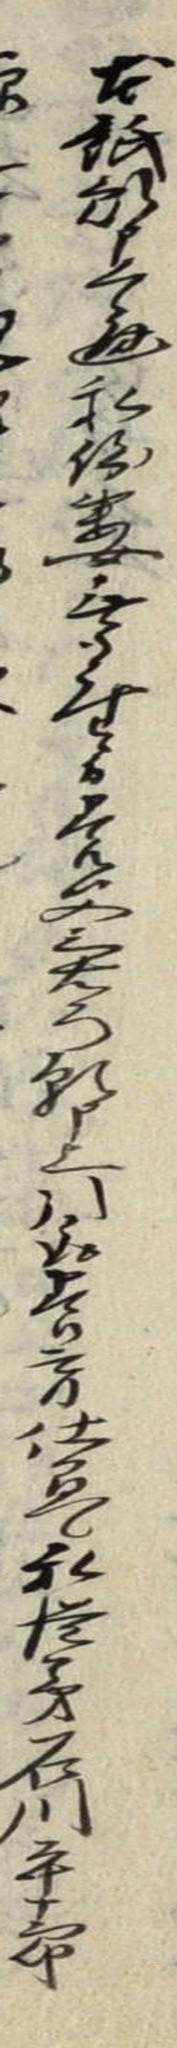本紙願申上候通私儀妻女御座候付養父三右衛門願申上引取養育仕置候私従弟石川平十郎
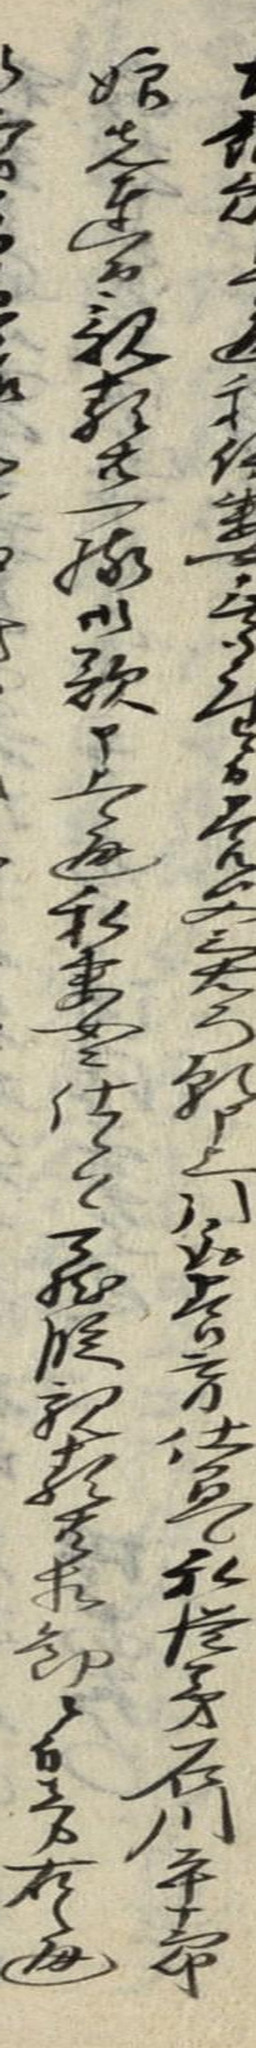娘先達而親類共一統御歎申上候通私妻女ニ仕候ハヽ可然段親類共相勧ニ旁右之通
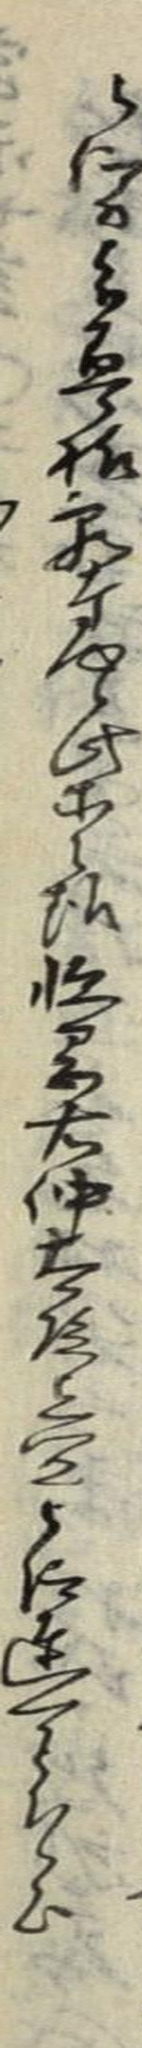被仰付被下置候様願奉存候此等之趣恒岡右仲太殿迄宜被仰達可被下候以上
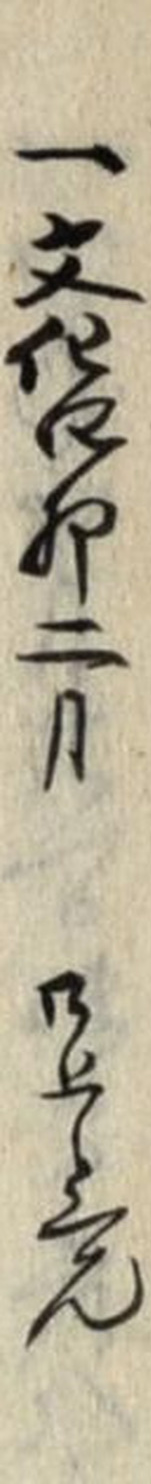一文化四卯二月口上之覚
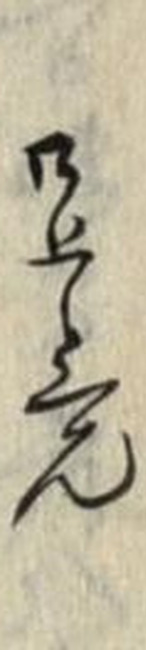口上之覚
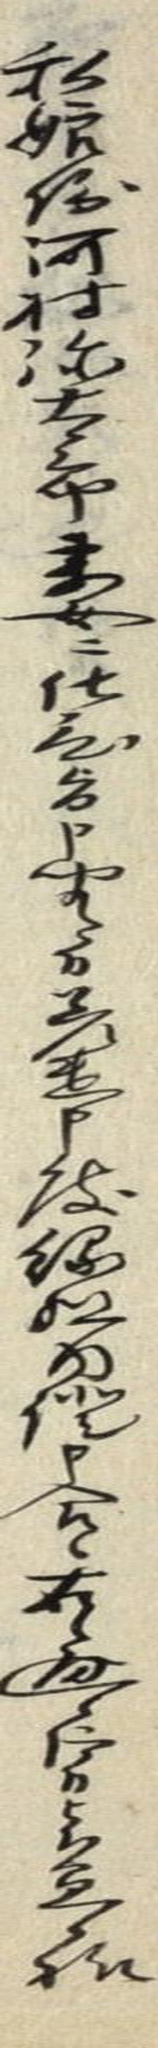私娘儀河村弥太郎妻女ニ仕度旨申聞候ニ付差遣申度縁組内証申合候右之通被仰付被下候様
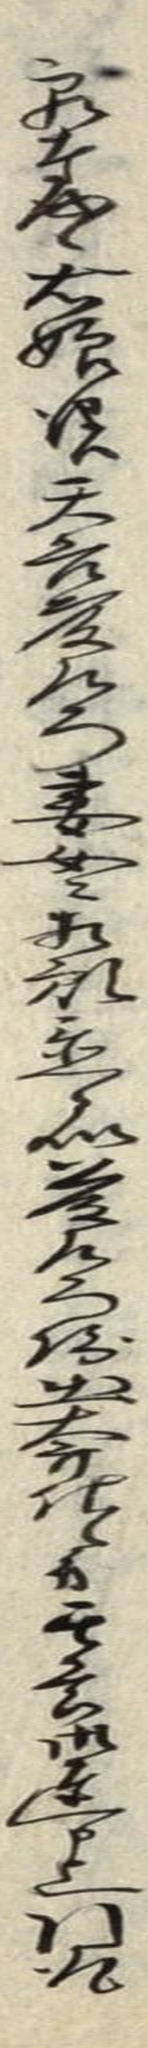願奉存候右娘儀ハ天谷藤左衛門妻女ニ相願置候処藤左衛門儀出奔仕候ニ付其節御達申上引取
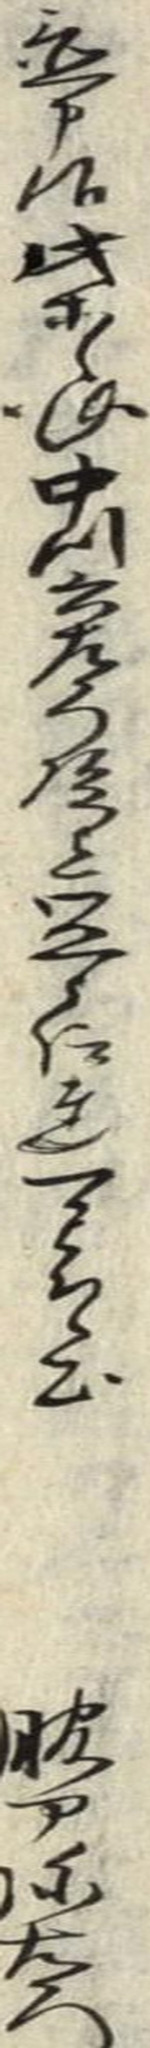置申候此等之趣中川六左衛門殿迄宜被仰達可被下候以上服部弥右衛門
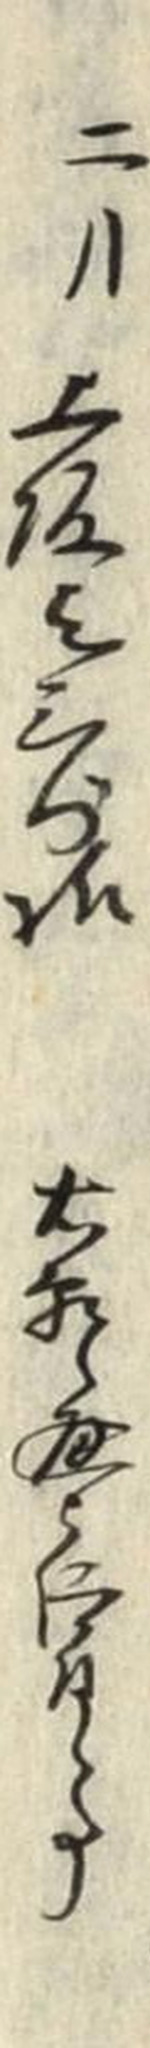二月上坂与三右衛門様右願候通被仰付候事
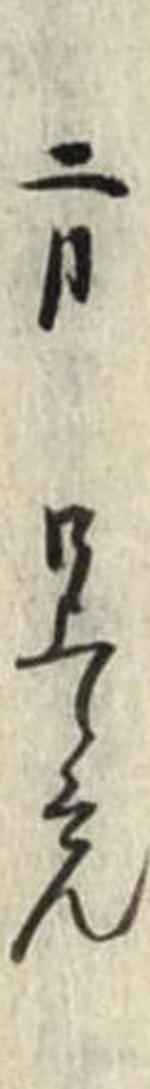一二月口上之覚
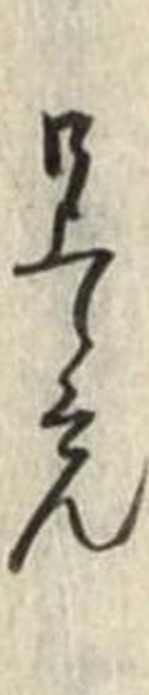口上之覚
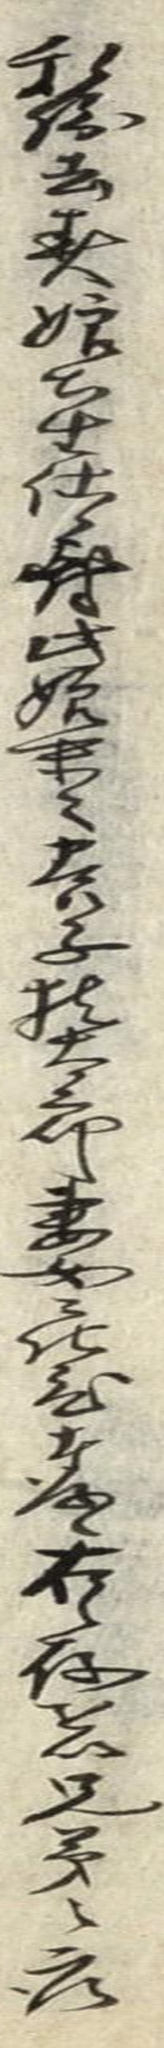私儀去春娘出生仕候ニ付此娘末々養子猪太郎妻女ニ仕度奉存候右之存を以兄弟ニ取
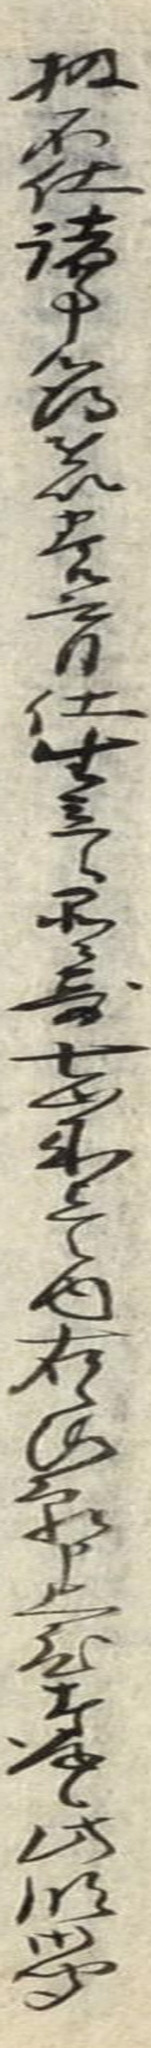扱不仕諸事心得を以養育仕生立候品ニ寄七歳迄之内右之趣願上度奉存候此段御聞
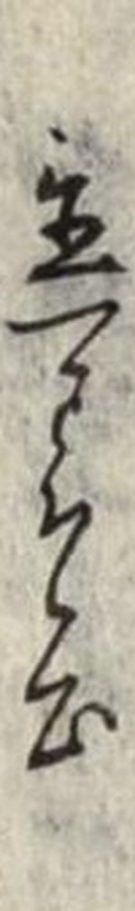置可被下候以上
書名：養子縁組之部
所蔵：福井県文書館 Fukui Prefectural Archives
